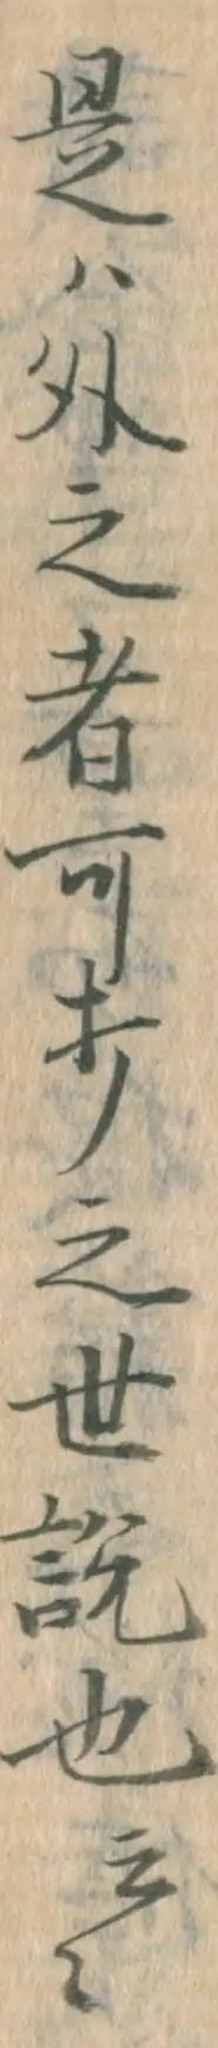是ハ外之者可打之世説也云々
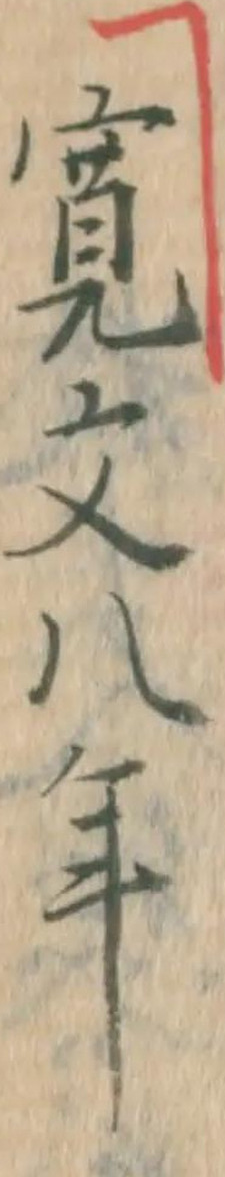寛文八年
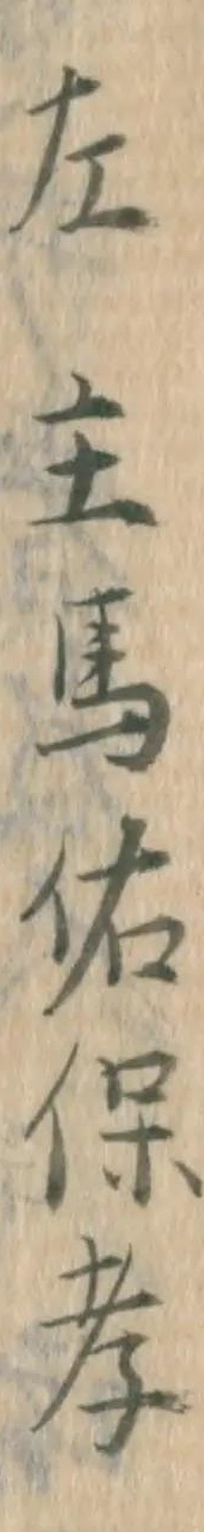左主馬祐保孝
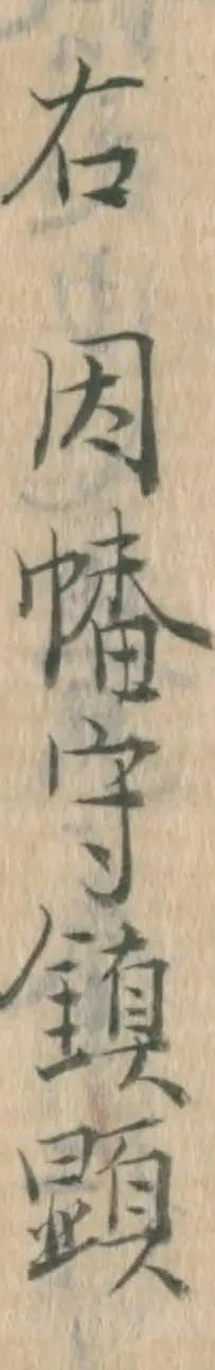右因幡守鎮顕
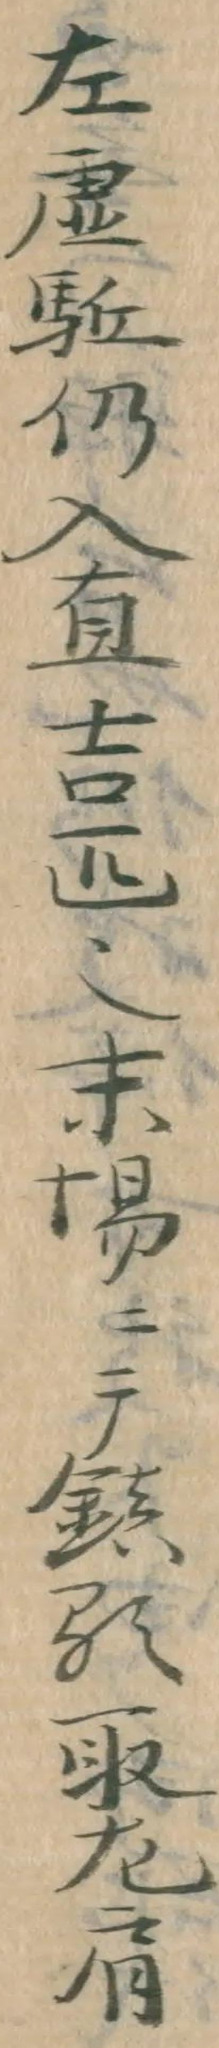左虚駈仍入直吉匹也末場ニテ鎮顕取左肩
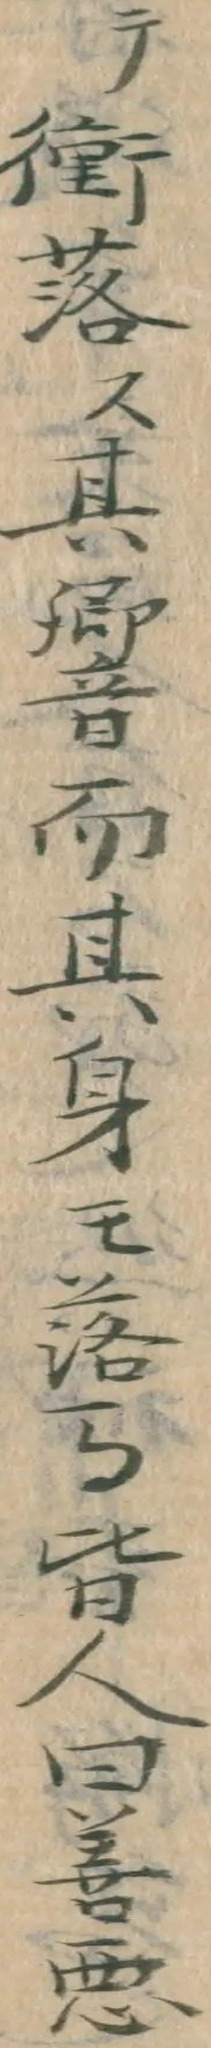テ衝落ス其響而其身モ落馬皆人曰善悪
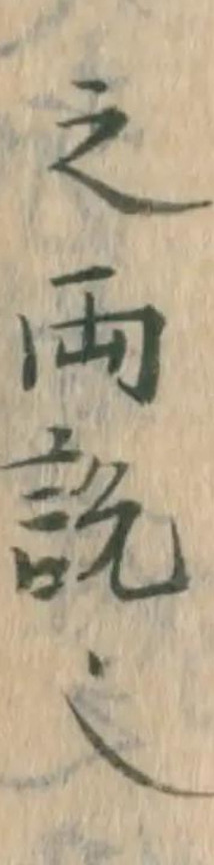之両説也
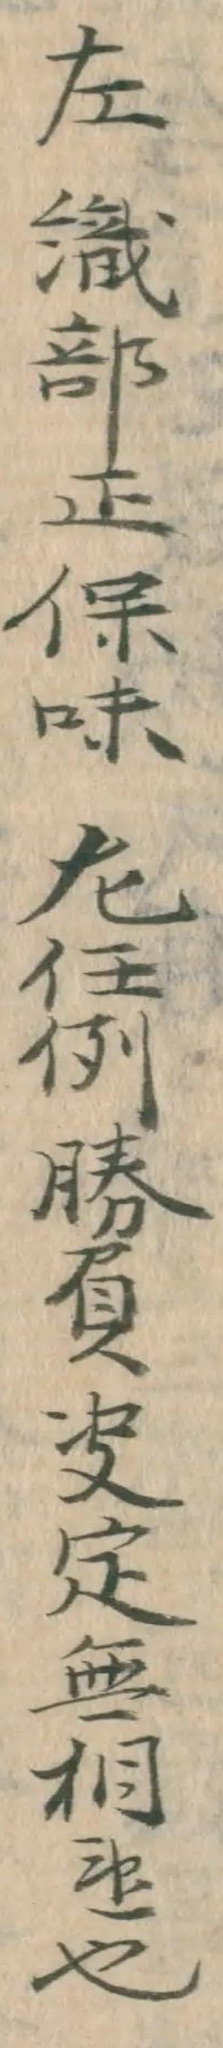左織部正保味左任例勝負決定無相違也
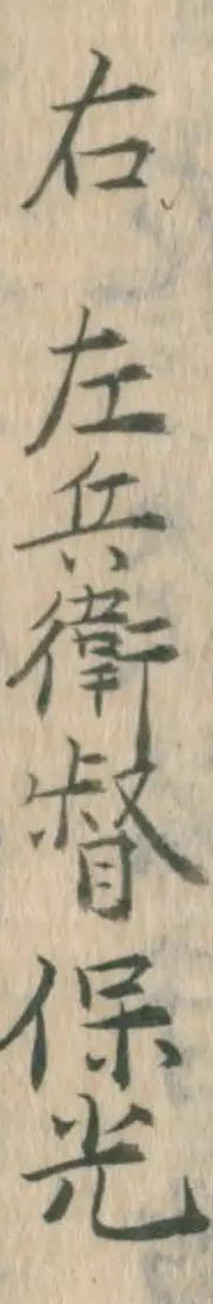右左兵衛督保光
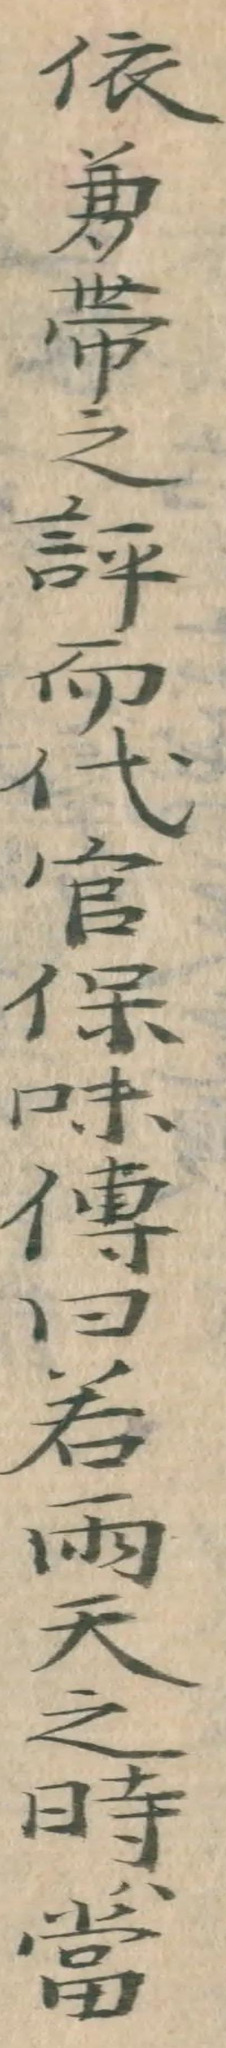依兼帯之評而代官保味伝曰若雨天之時ハ当
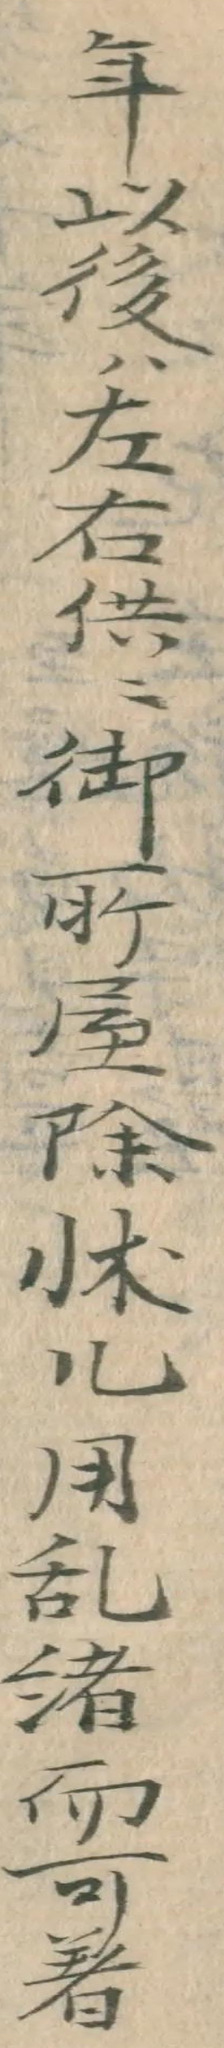年以後ハ左右供ニ御所屋除牀几用乱緒而可着
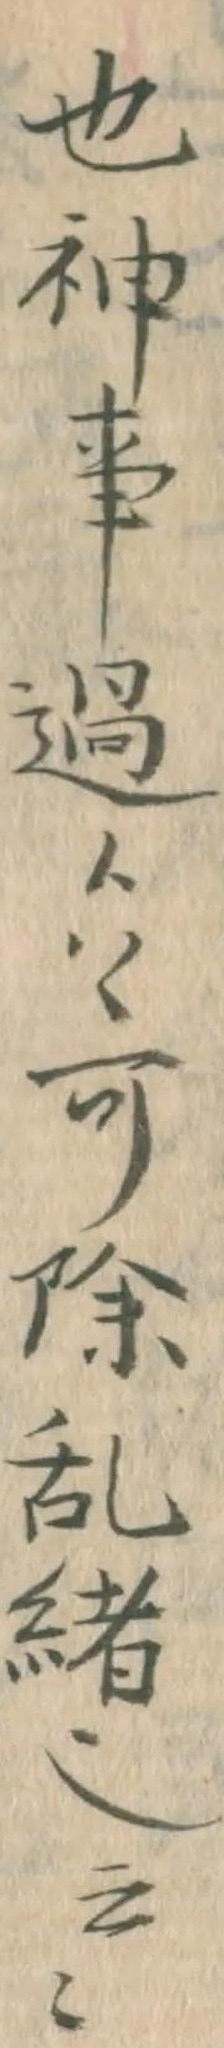也神事過候ハゝ可除乱緒也云々
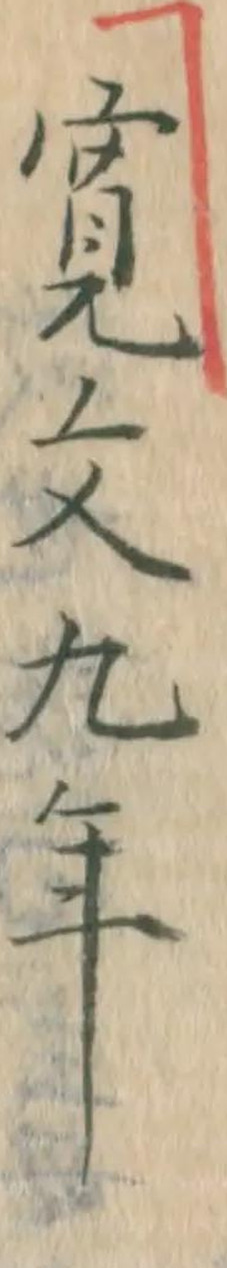寛文九年
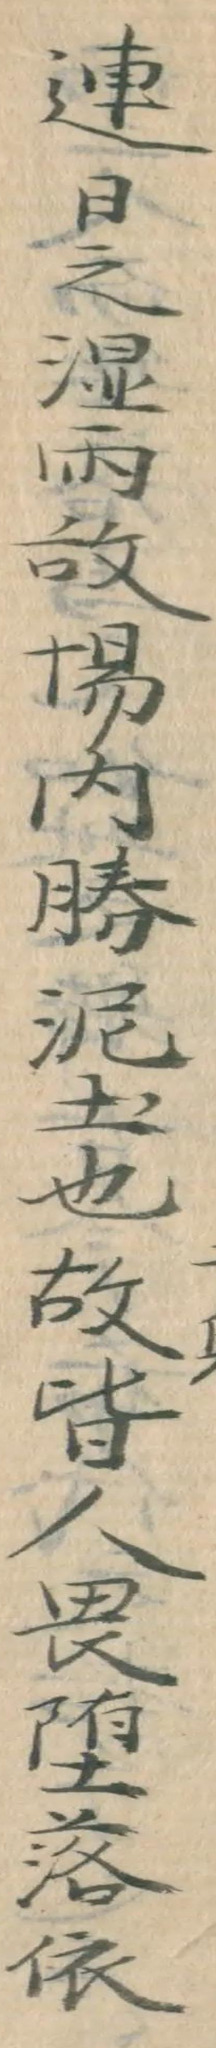連日之湿雨故場内勝泥土也故皆人畏堕落依

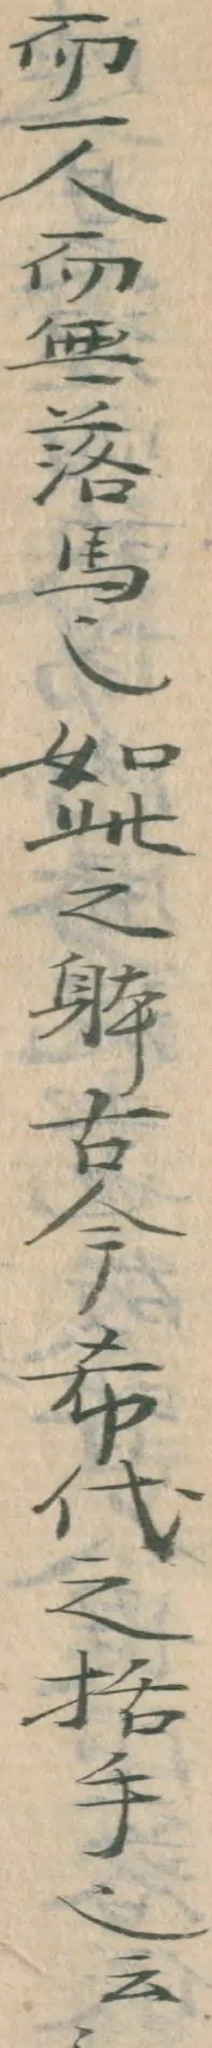而一人而無落馬也如此之体古今希代之括乎也云々
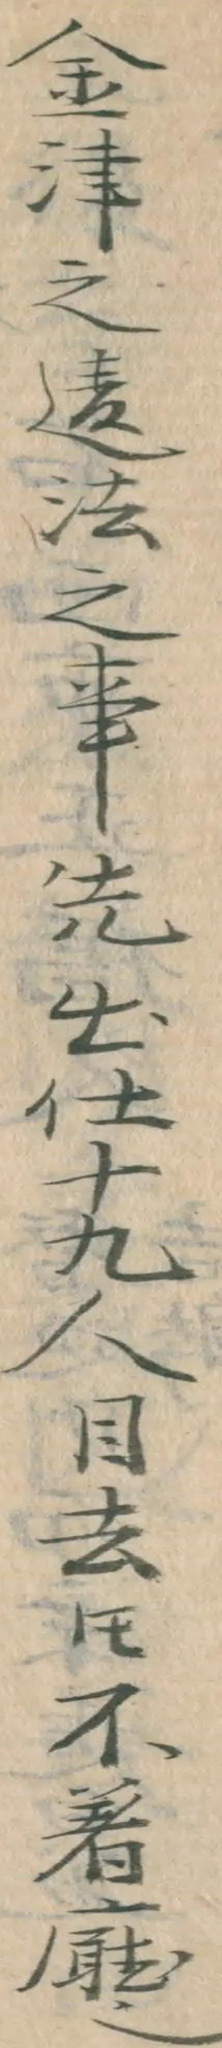金津之違法之事先出仕十九人目去トモ不着庁也
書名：賀茂社記録. 第10冊
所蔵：国立国会図書館 National Diet Library, JAPAN
